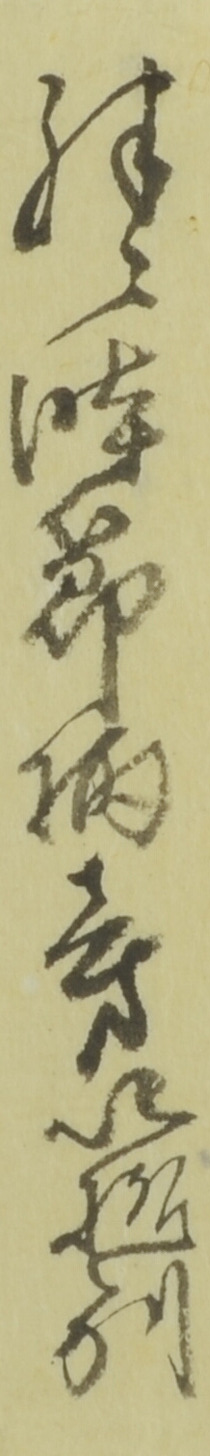殊ニ時節柄旁以格別
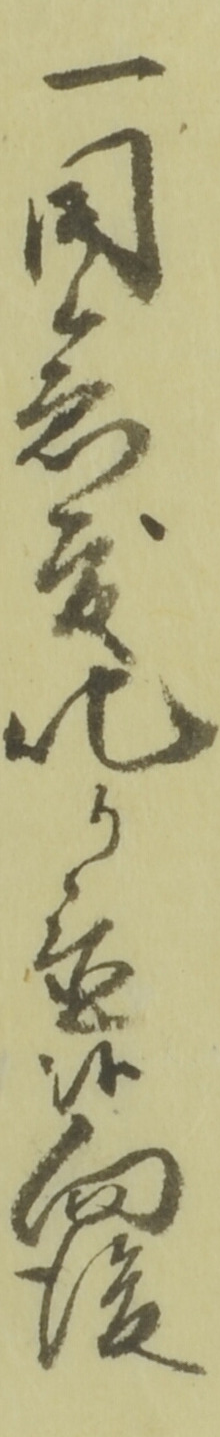一同急度叱り置候向後
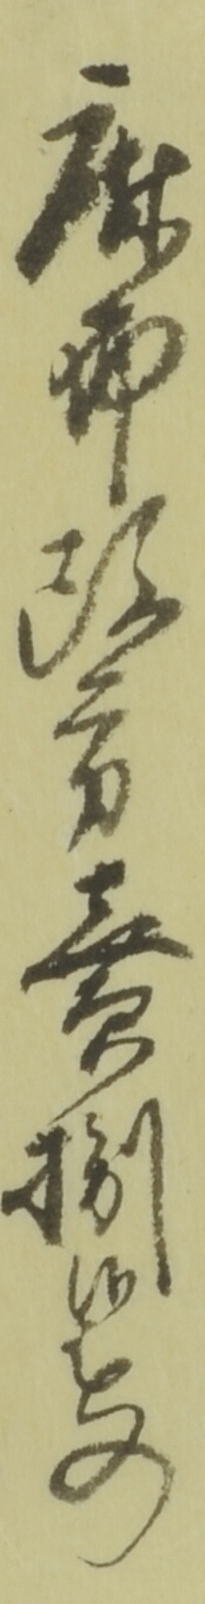麻布改方売捌候もの
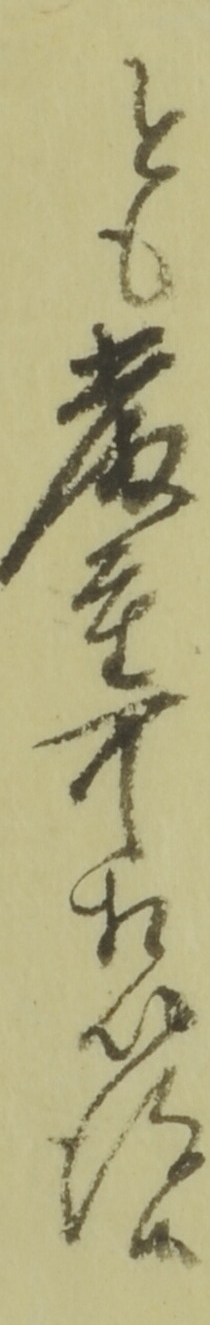とも厳重可相心得候
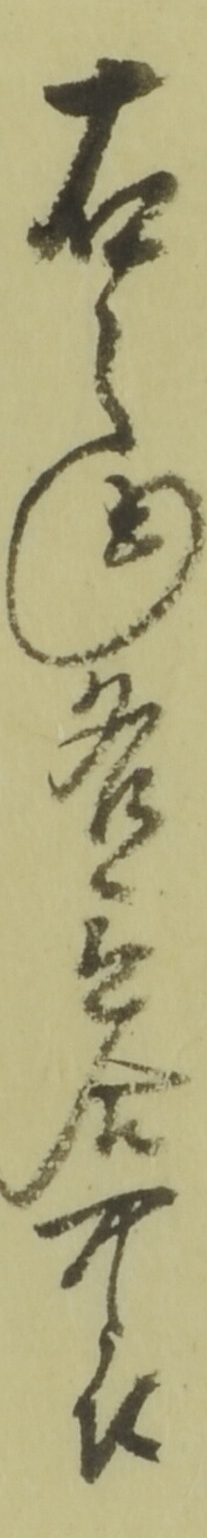右之趣各立合可被
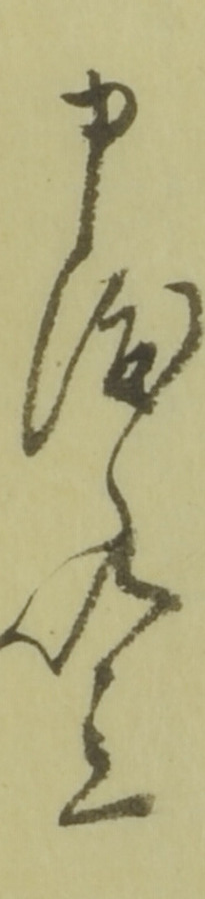申渡候以上
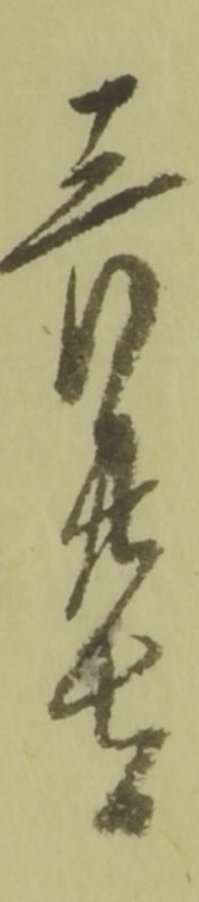十二月廿七日
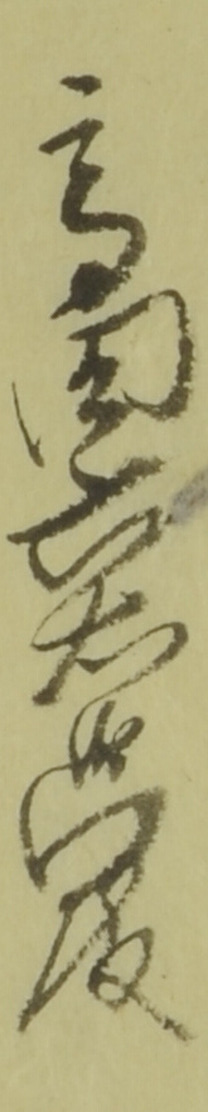高田六右衛門殿
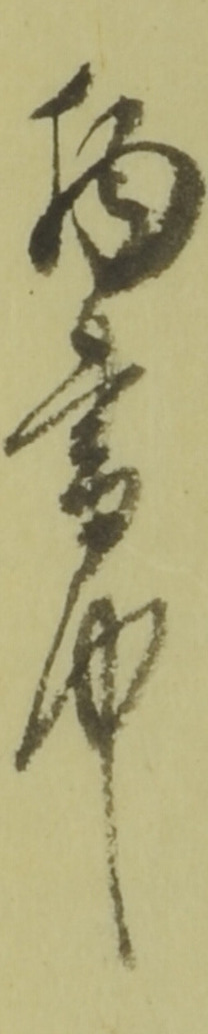物書中

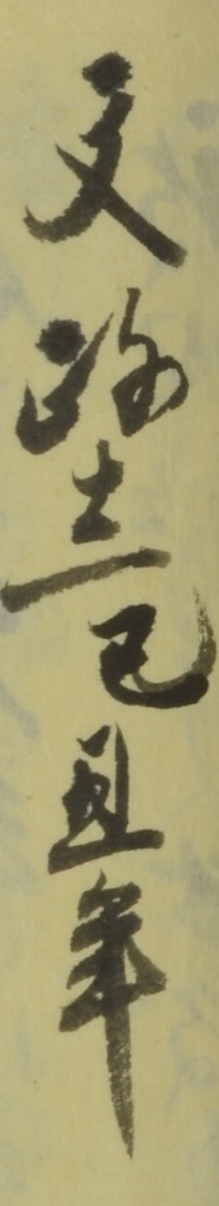文政十二己丑年

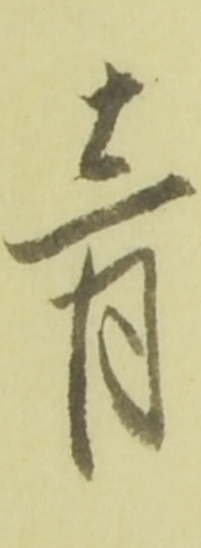十二月
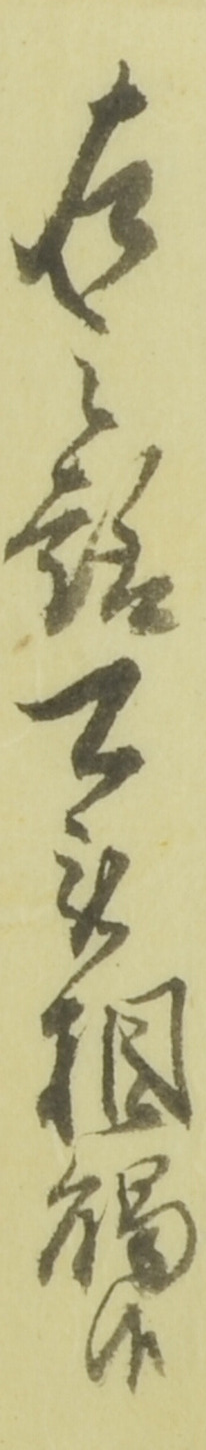右之趣可被相触候
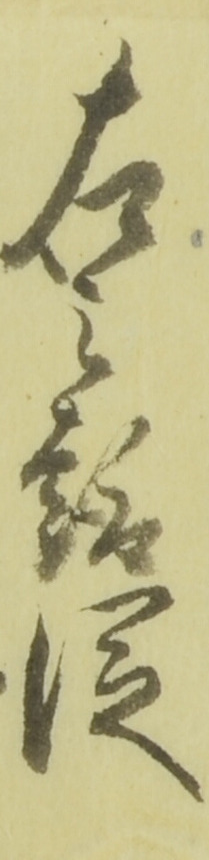右之趣従
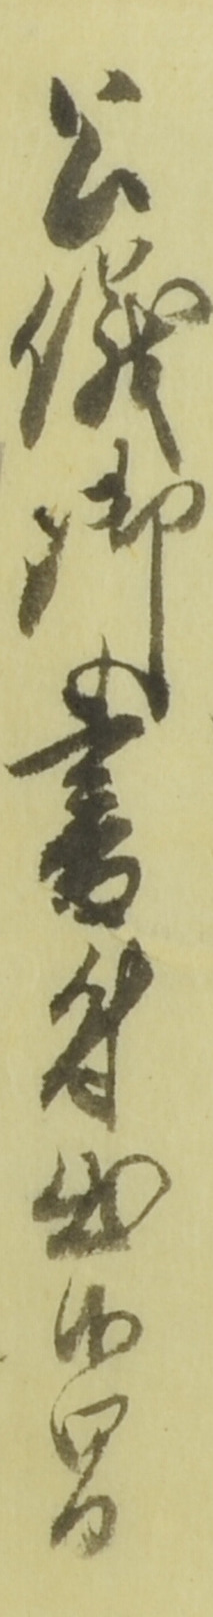公儀御書付出候間
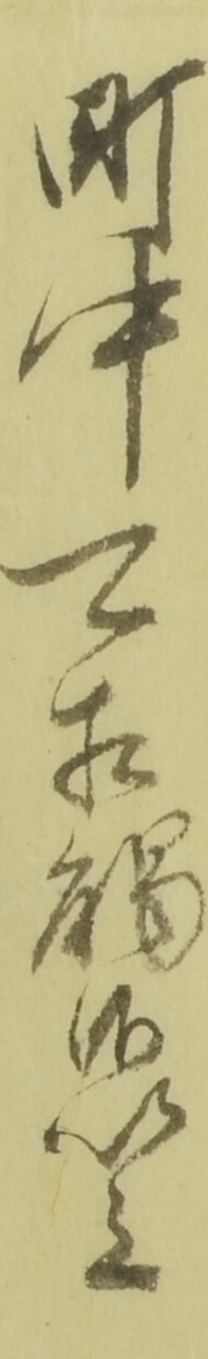町中可相触候以上
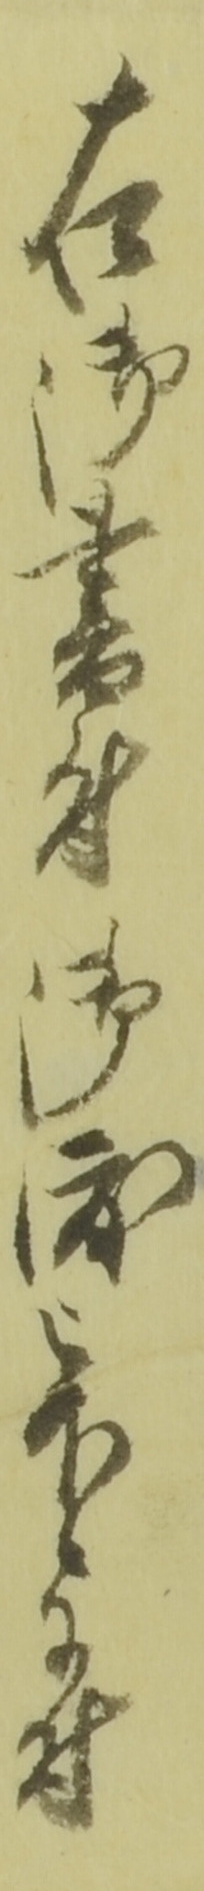右御書付御渡被下候に付
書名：御触書御書附控
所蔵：伊那市立高遠町図書館・合同会社AMANE
